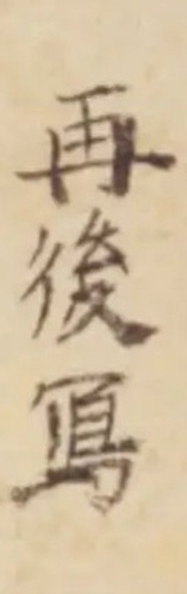再後寫
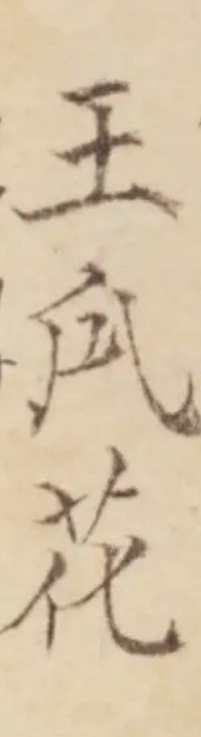王瓜花
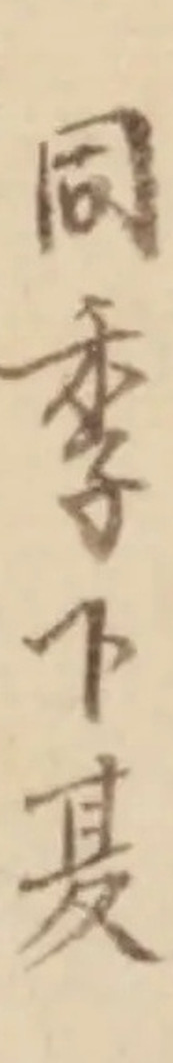同季下其
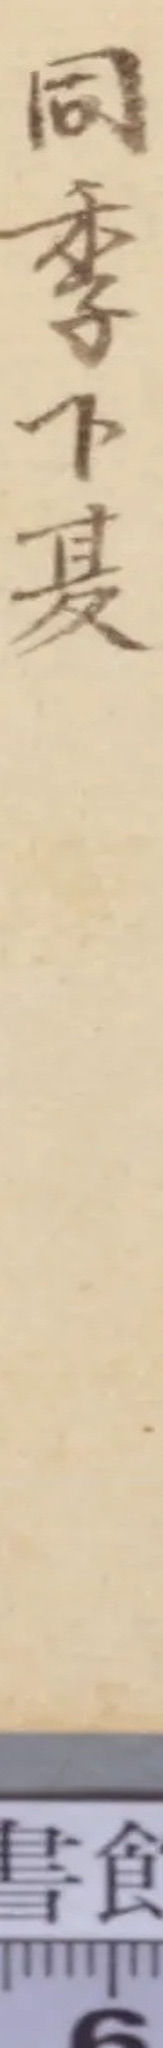同季下其
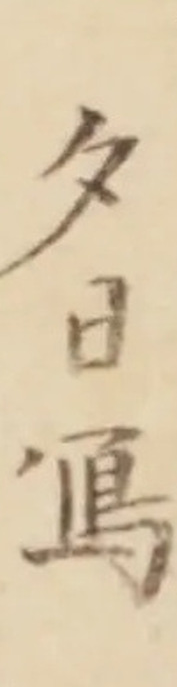夕日寫
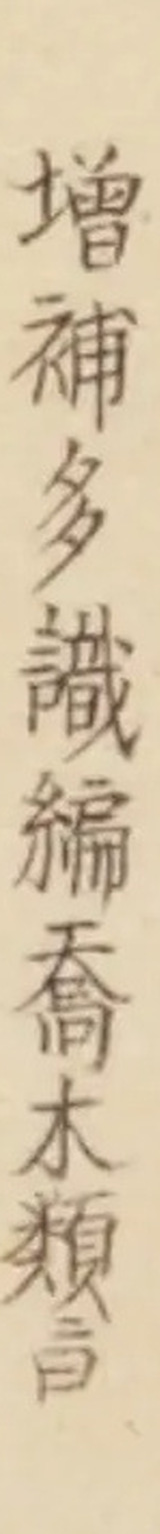増補多識編喬木類ニ曰
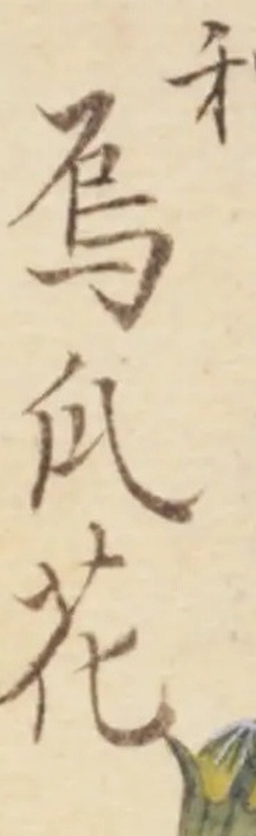王瓜花
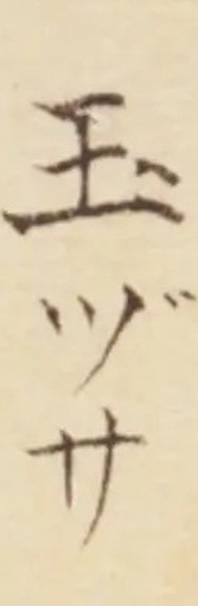玉ヅサ
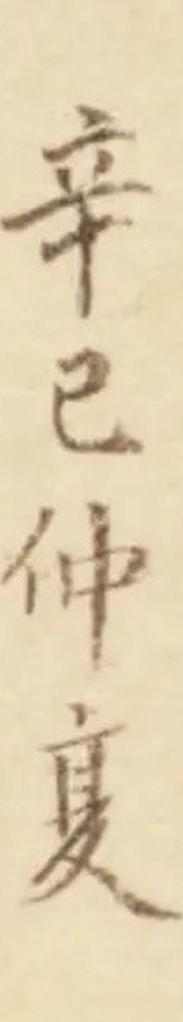辛巳仲夏
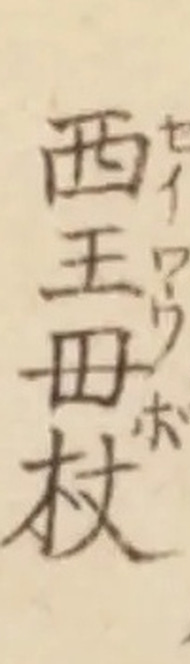西王母杖
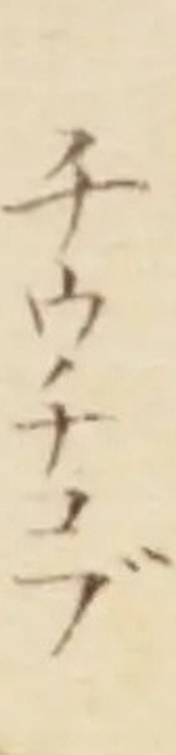チウチコブ
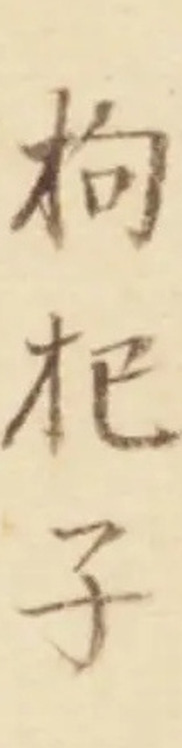枸杞子
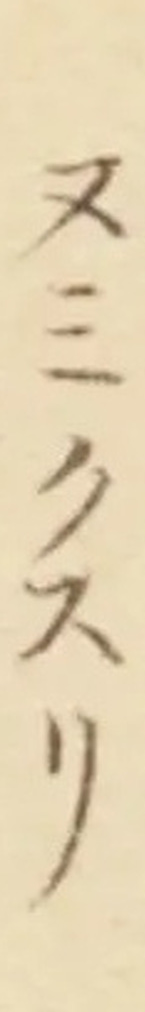ヌミクスリ
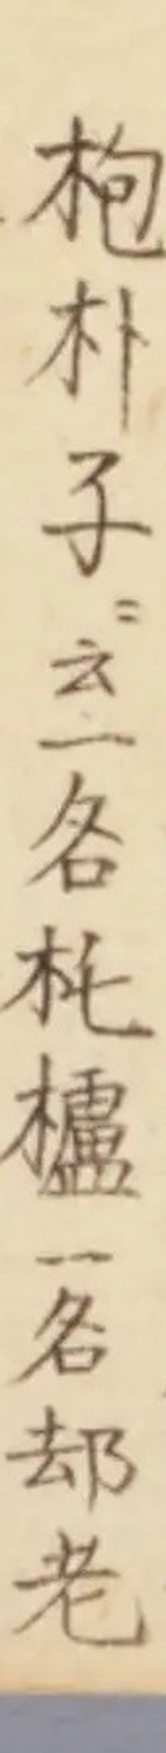枸朴子ニ云一名杔櫨一名却老
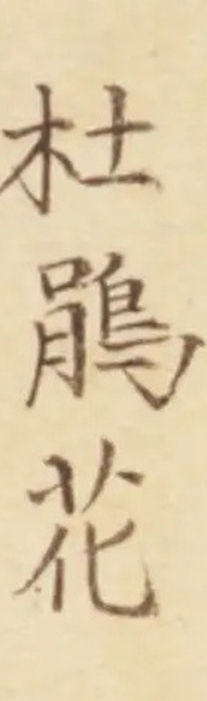杜鵑花
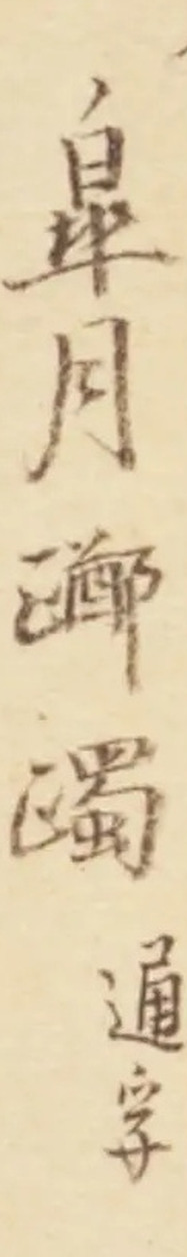皐月躑躅通字
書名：梅園草木花譜夏之部. 1
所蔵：国立国会図書館 National Diet Library, JAPAN
